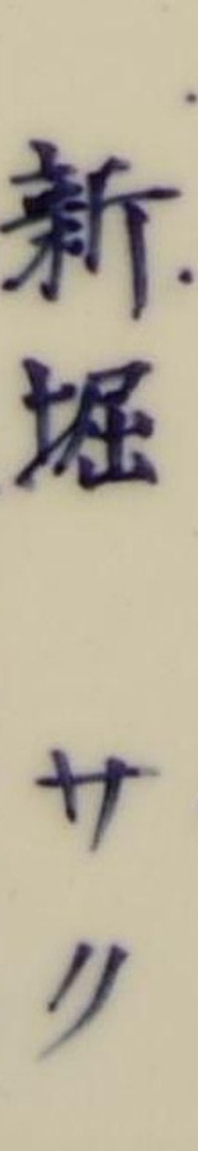新堀サク
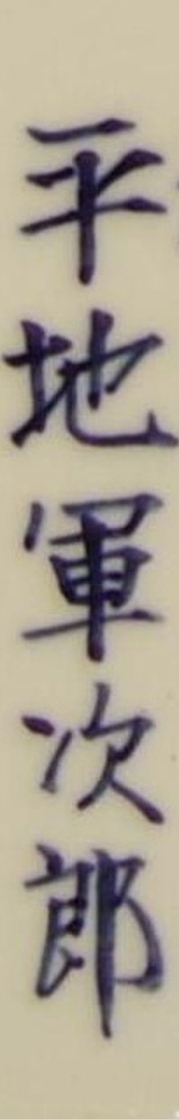平地軍次郎

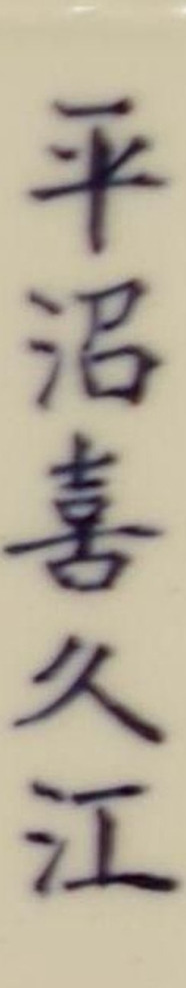平沼喜久江
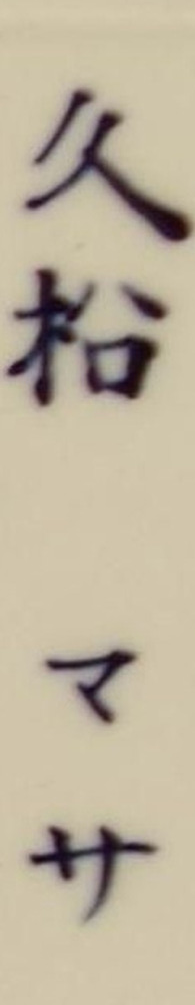久松マサ
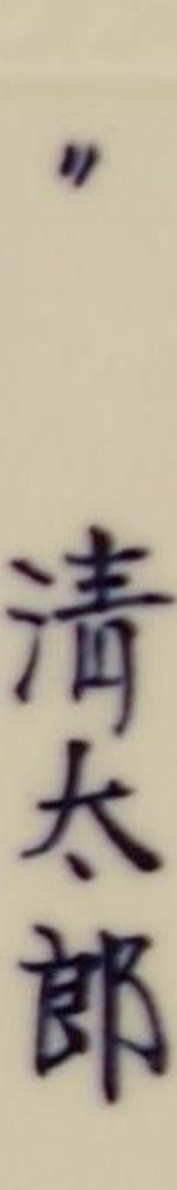清太郎
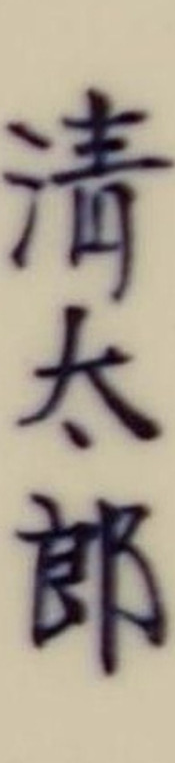清太郎
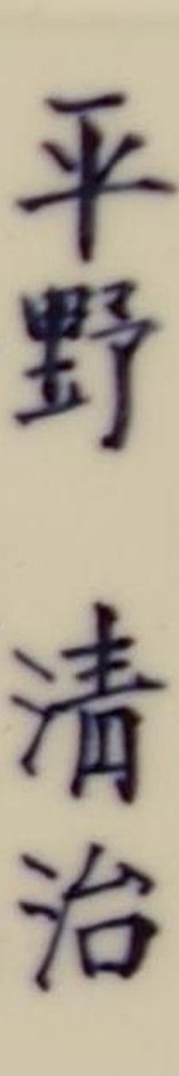平野清治
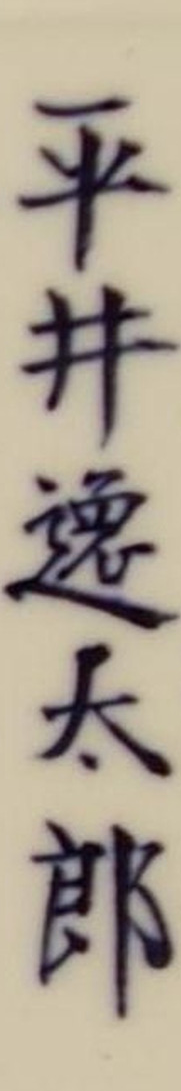平井逸太郎
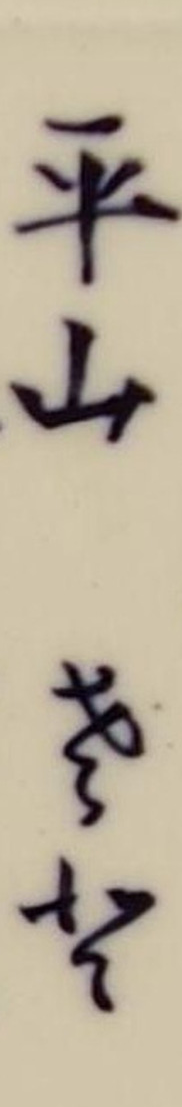平山さと
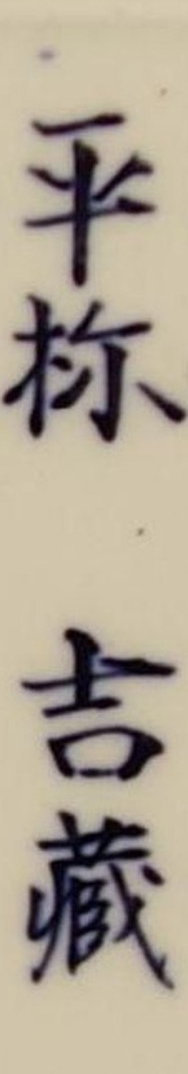平祢吉蔵
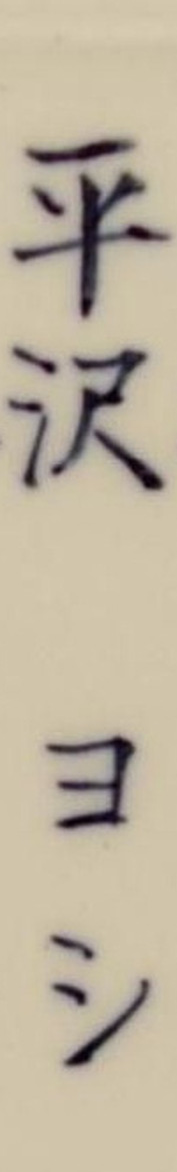平沢ヨシ
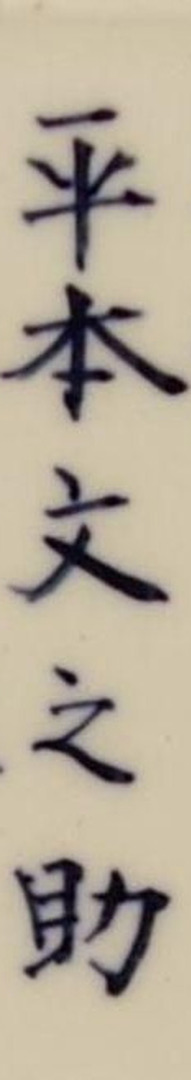平本文之助
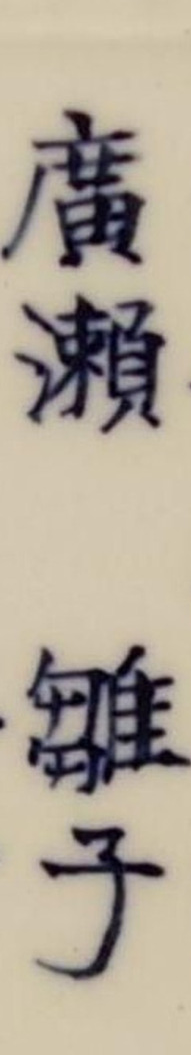廣瀬雛子
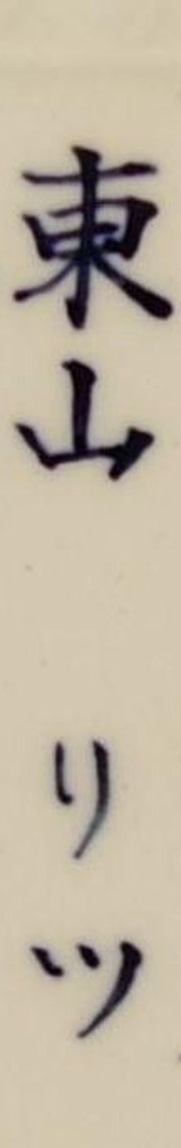東山リツ
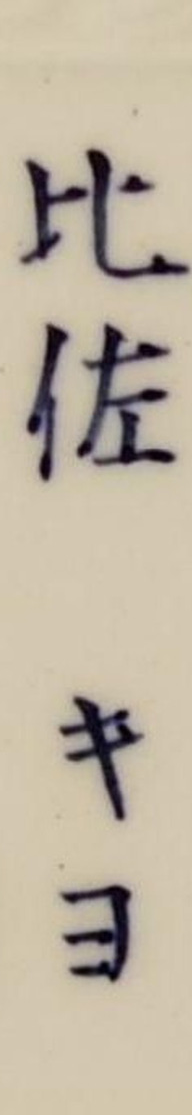比佐キヨ
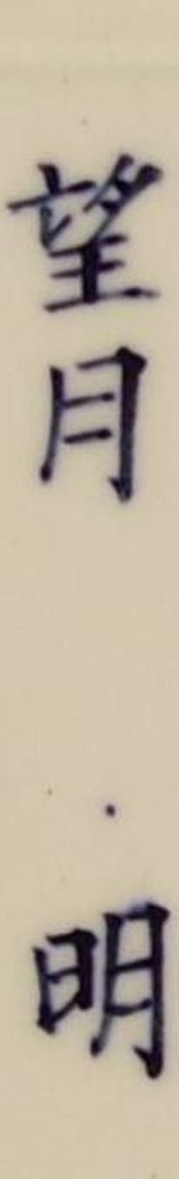望月明
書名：E~L
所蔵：高野山金剛峯寺
